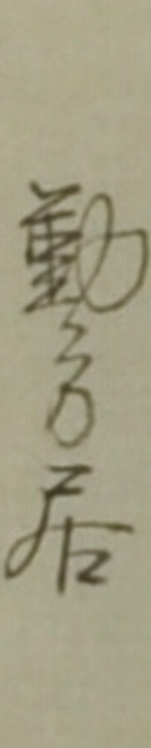勤方居
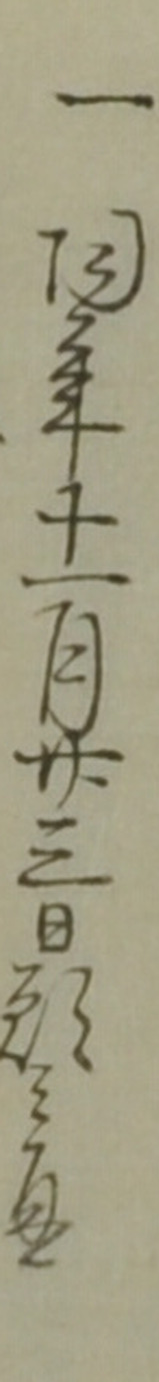一同年十一月廿三日願之通
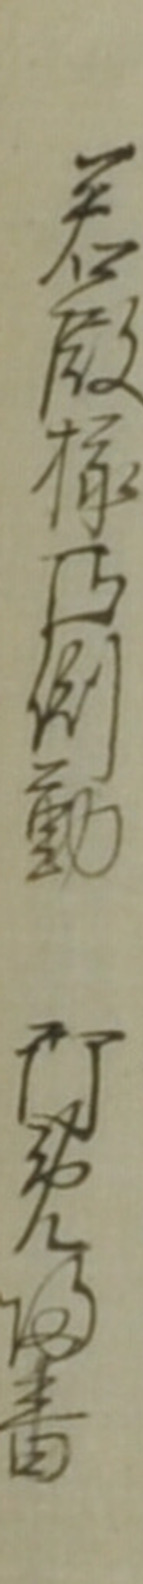若殿様御側勤御免帰番
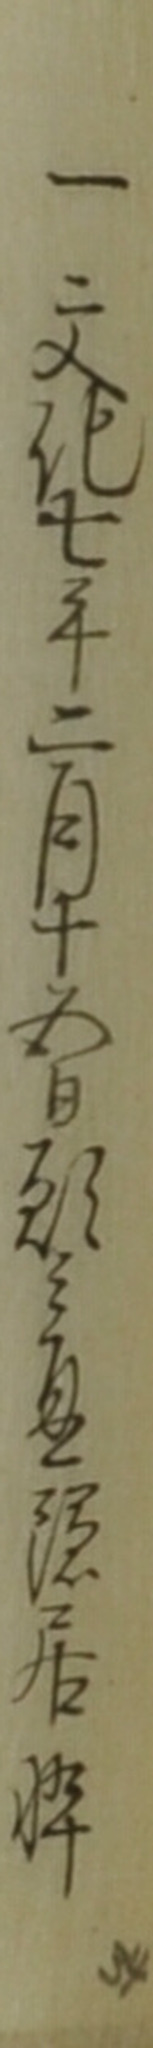一文化七午二月十五日願之通隠居忰
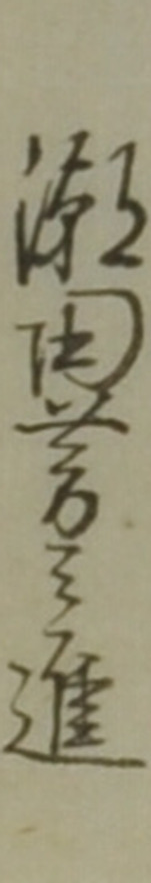潮田芳之進
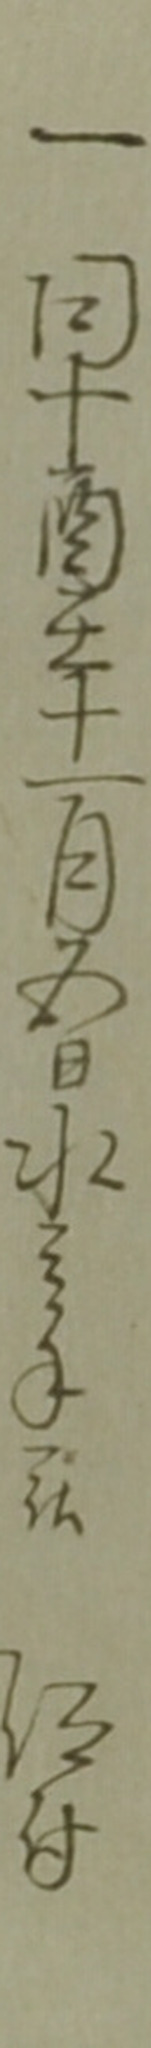一同十酉閏十一月五日水之手被仰付
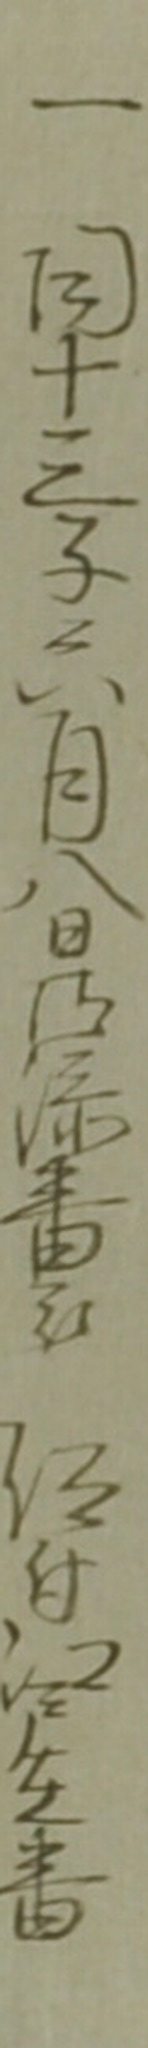一同十三子六月八日御添番被仰付江戸在番
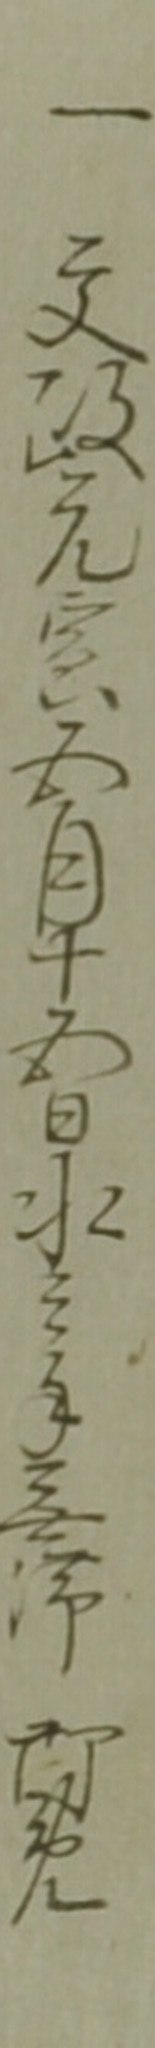一文政元寅五月十五日水之手無滞御免
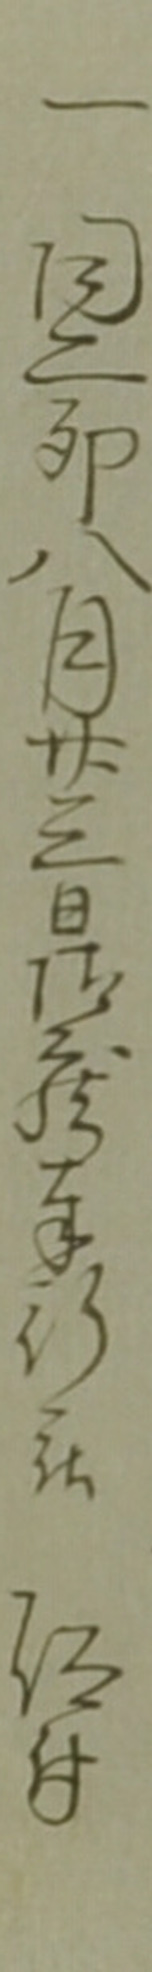一同ニ卯八月廿三日御蔵奉行被仰付
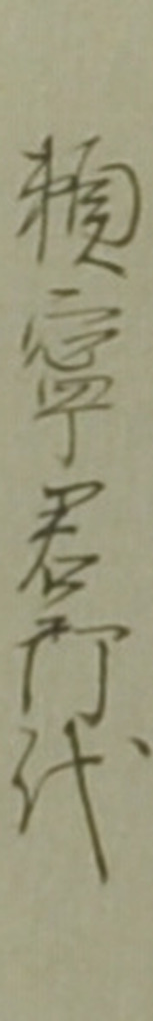頼寧君御代
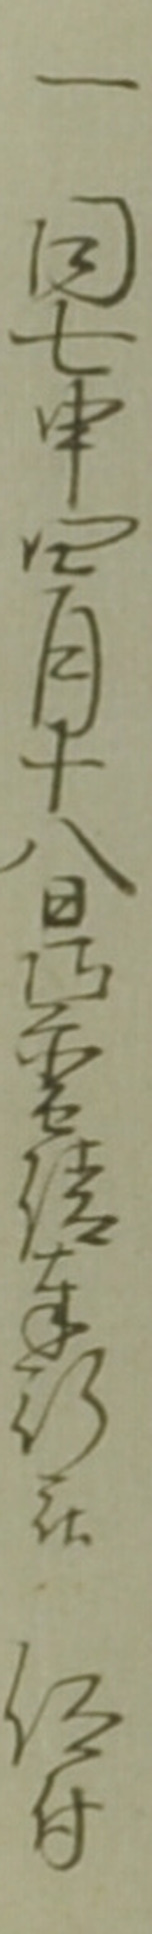一同七申四月十八日御普請奉行被仰付
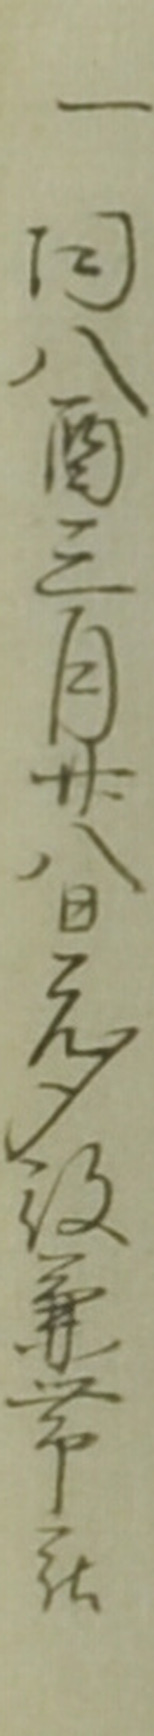一同八酉三月廿八日元〆役兼帯被

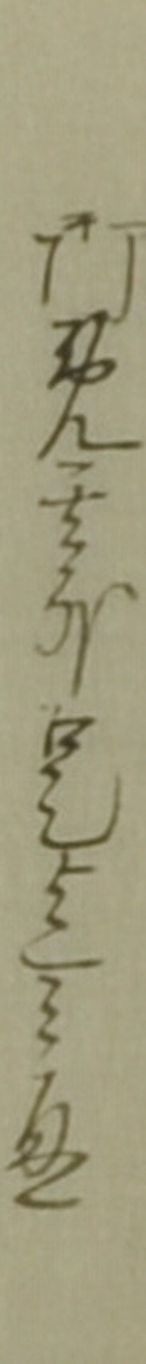御免其外是迄之通
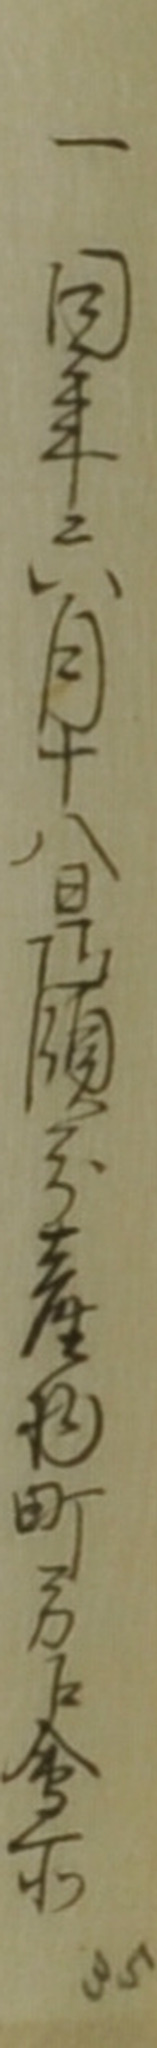一同年六月十八日御領分産物町方江会所
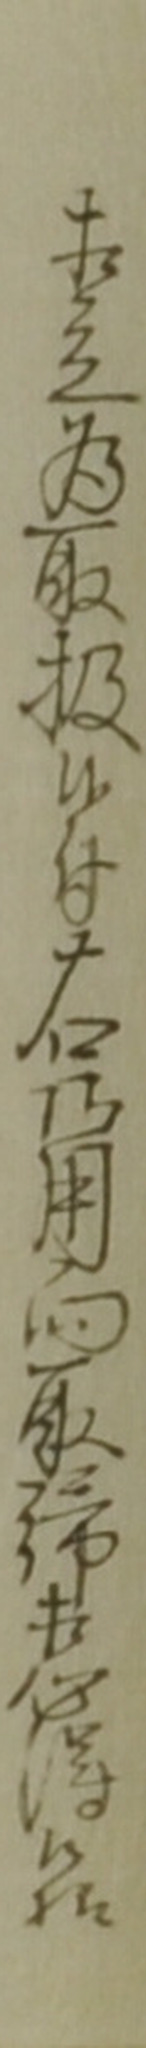相立為取扱候付右御用向取締相心得候様
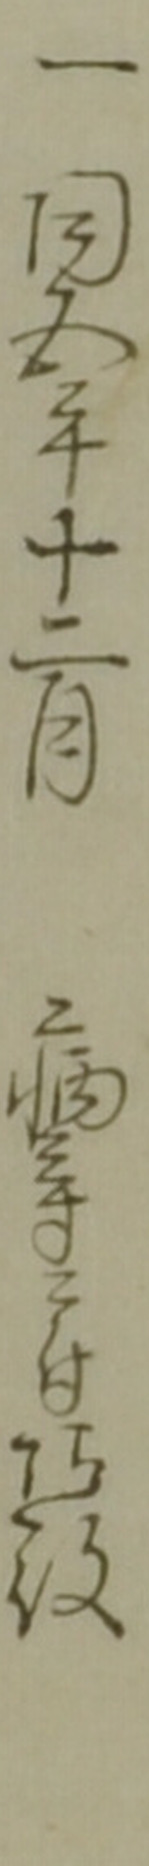一同五午十二月病気ニ付御役
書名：給人諸士勤仕録（三）
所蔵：伊那市立高遠町図書館・合同会社AMANE
